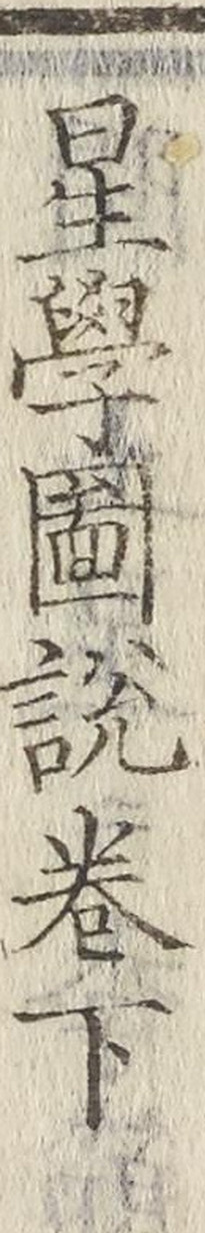星学図説巻下
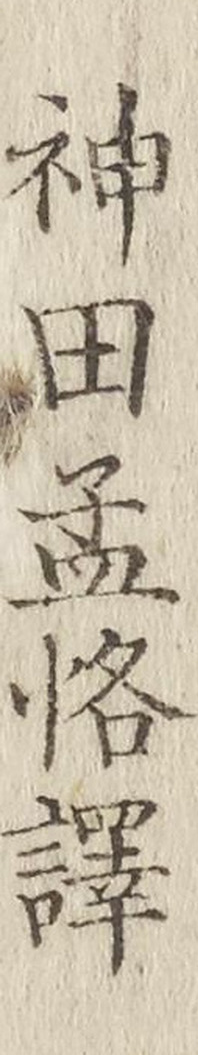神田孟恪訳
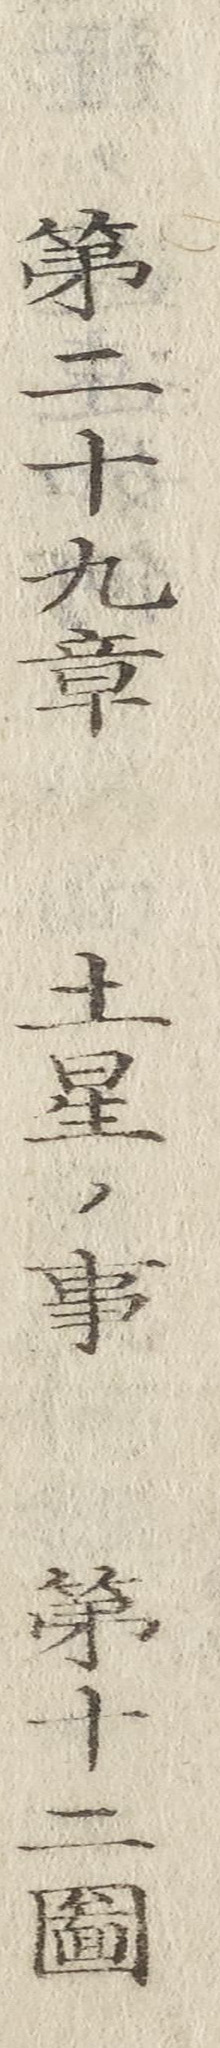第二十九章土星ノ事第十二図
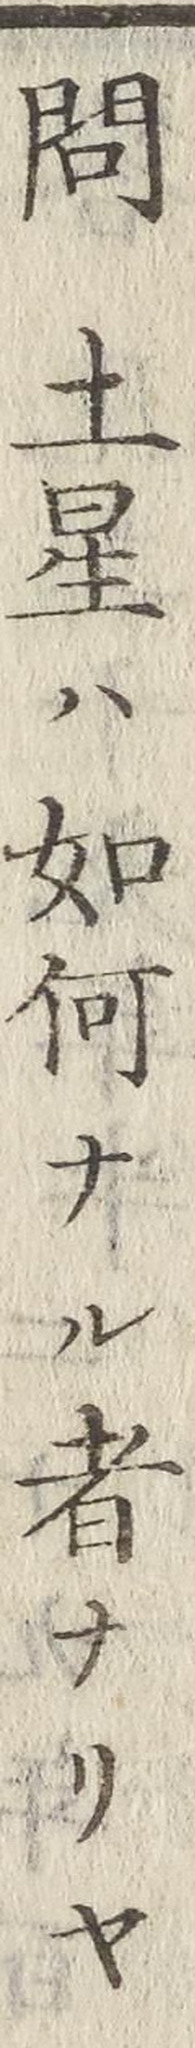問土星ハ如何ナル者ナリヤ
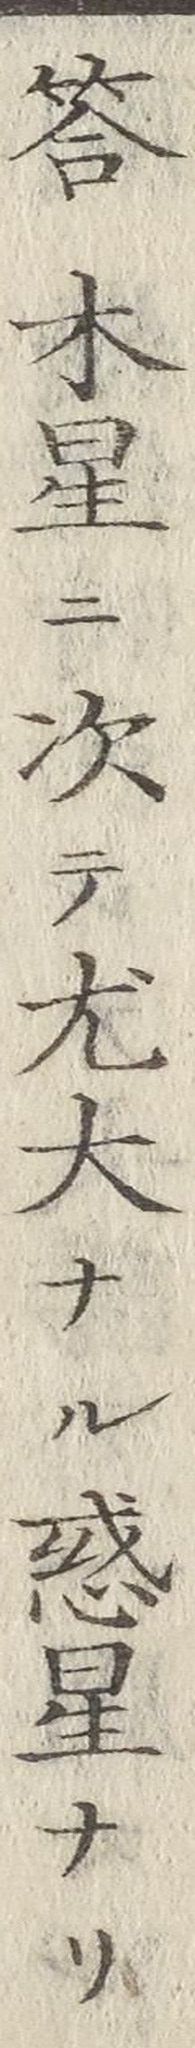答木星ニ次テ尤大ナル惑星ナリ
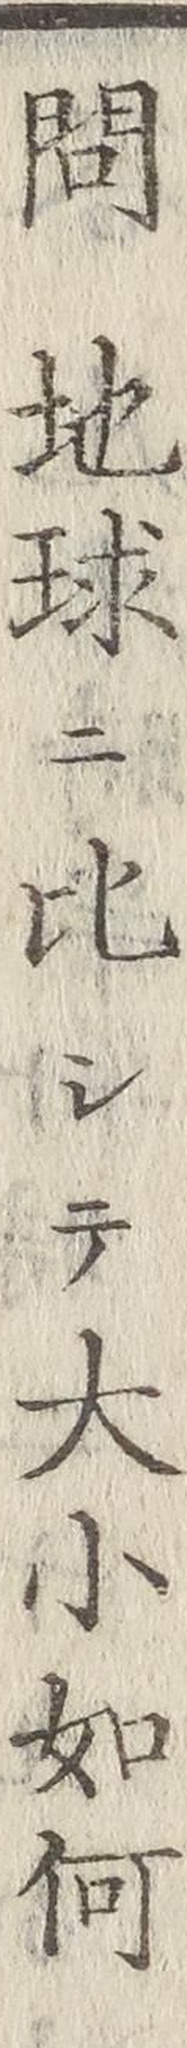問地球ニ比シテ大小如何
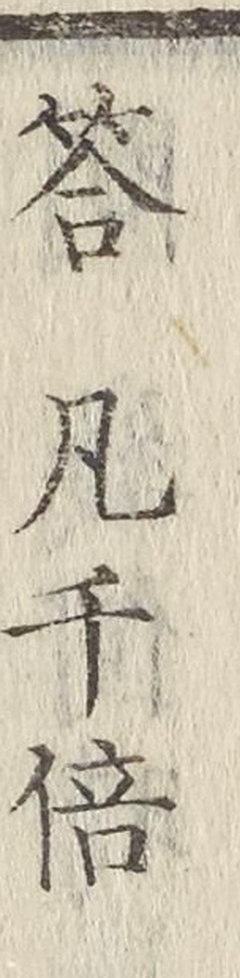答凡千倍
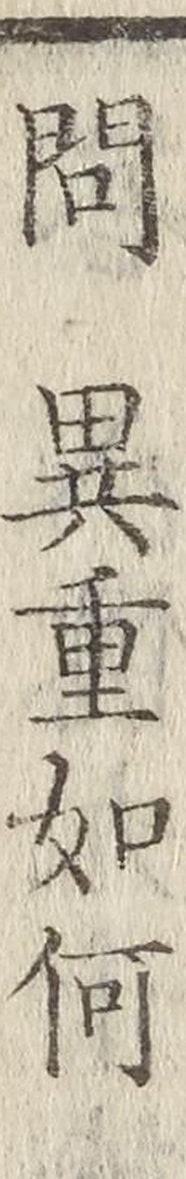問異重如何
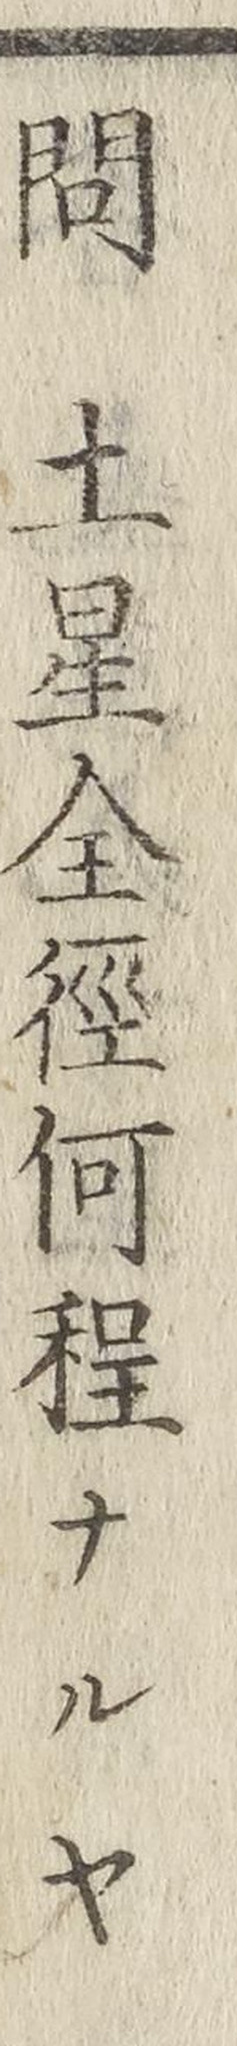問土星全径何程ナルヤ

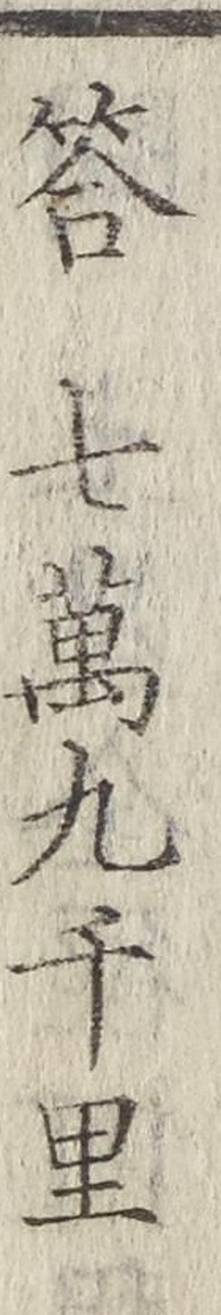答七万九千里
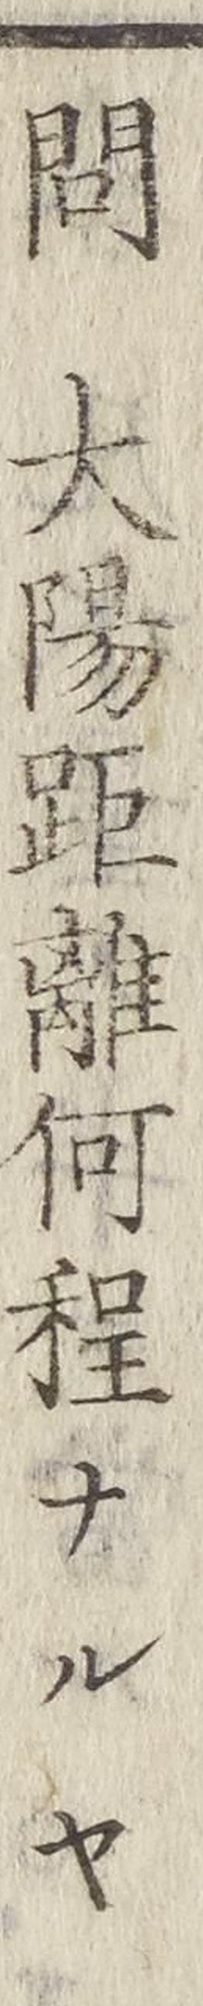問大陽距離何程ナルヤ
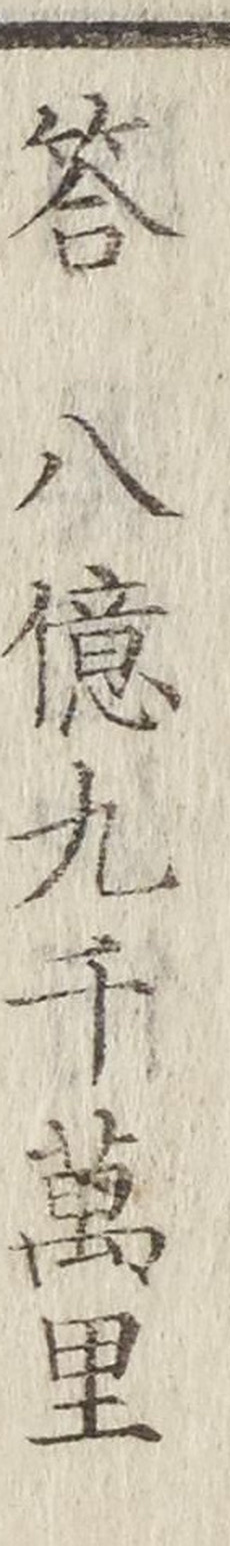答八億九千万里
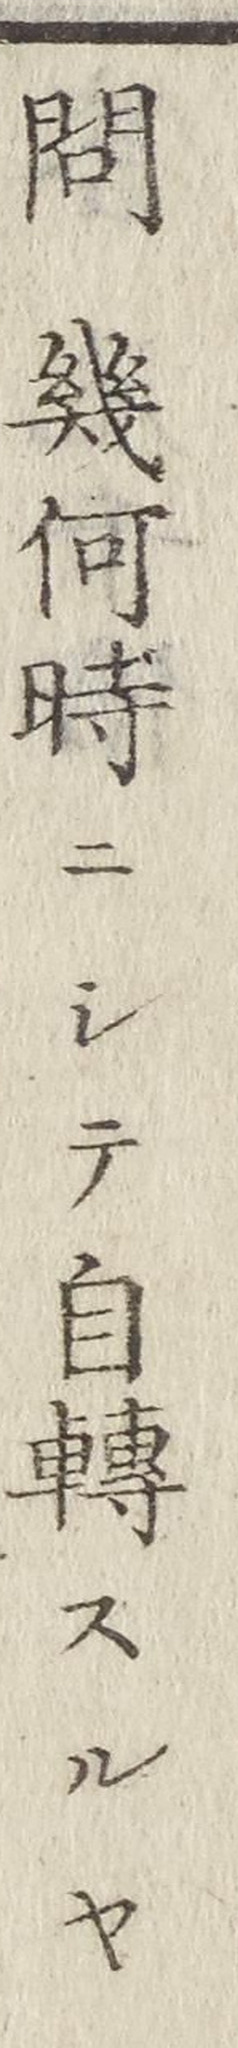問幾何時ニシテ自転スルヤ
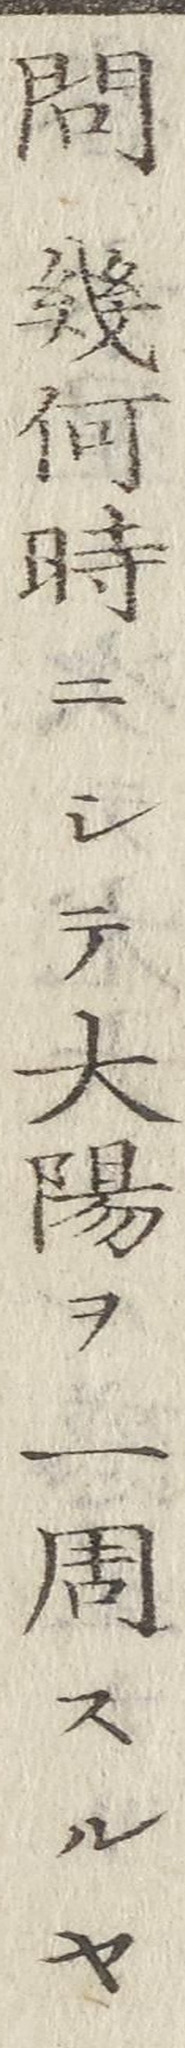問幾何時ニシテ大陽ヲ一周スルヤ
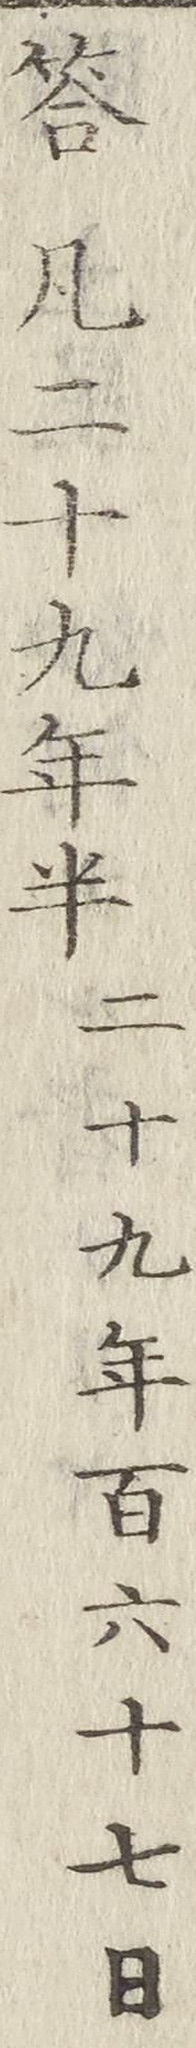答凡二十九年半二十九年百六十七日
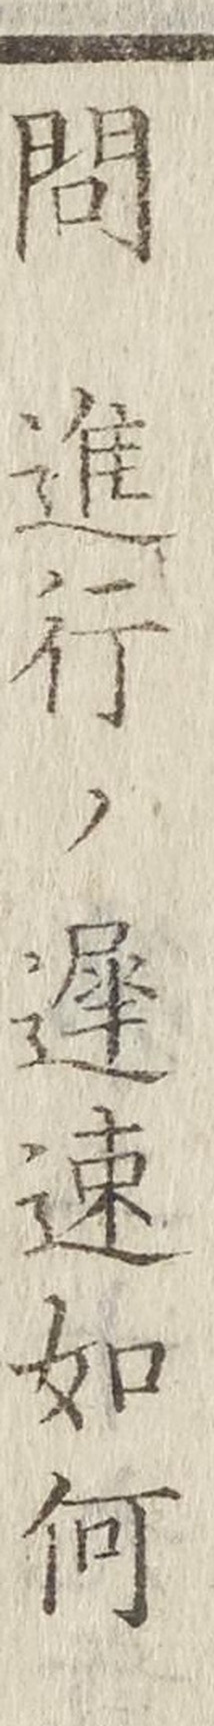問進行ノ遅速如何
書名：星学圖説　下
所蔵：東京大学地震研究所図書室 Earthquake Research Institute Library, The University of Tokyo, JAPAN
